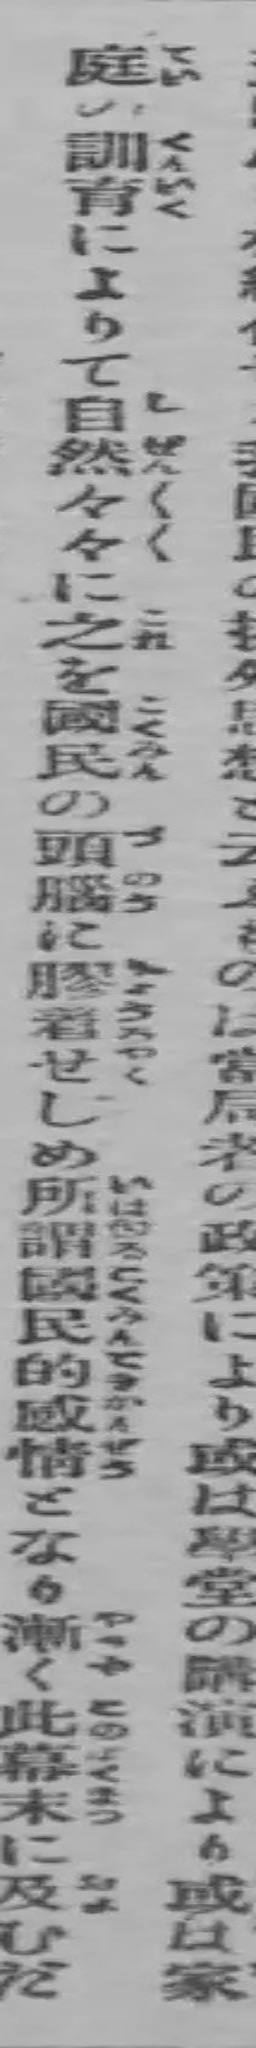庭の訓育によりて自然々々に之を国民の頭脳に膠着せしめ所謂国民的感情となり漸く此幕末に及むだ
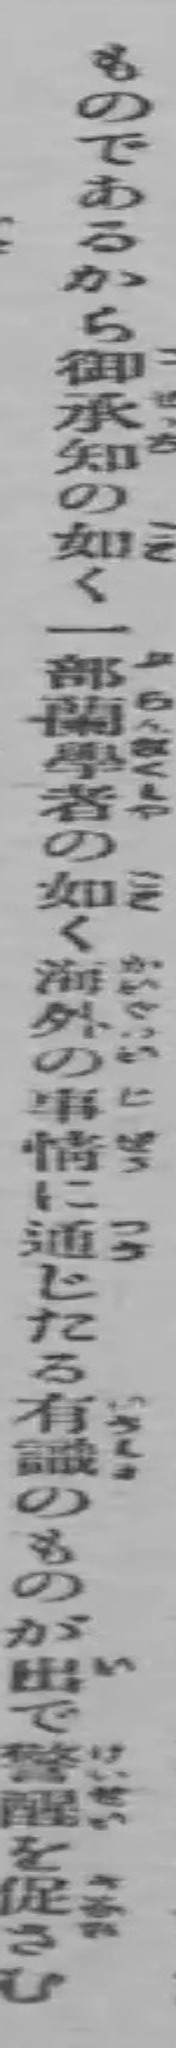ものであるから御承知の如く一部蘭学者の如く海外の事情に通じたる有識のものが出で警醒を促さむ
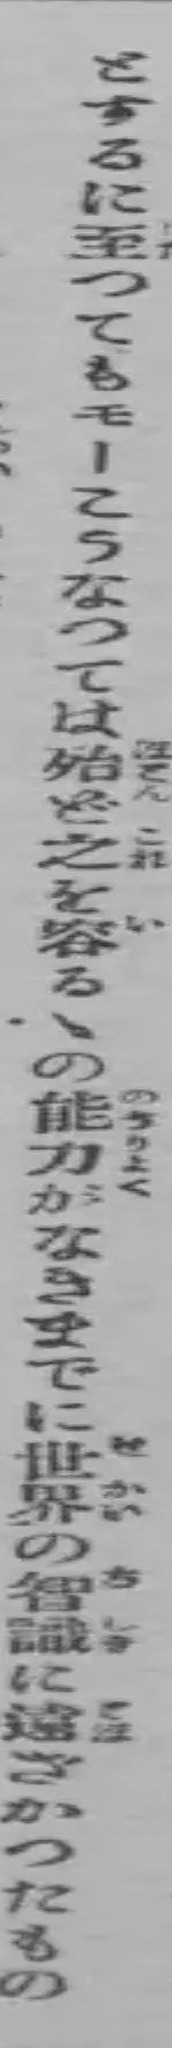とするに至つてもモーこうなつては殆ど之を容るゝの能力がなきまでに世界の智識に遠ざかつたもの
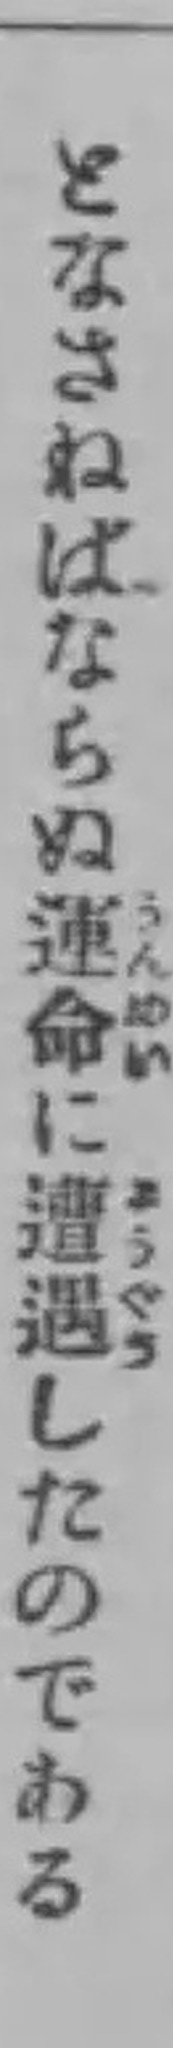となさねばならぬ運命に遭遇したのである
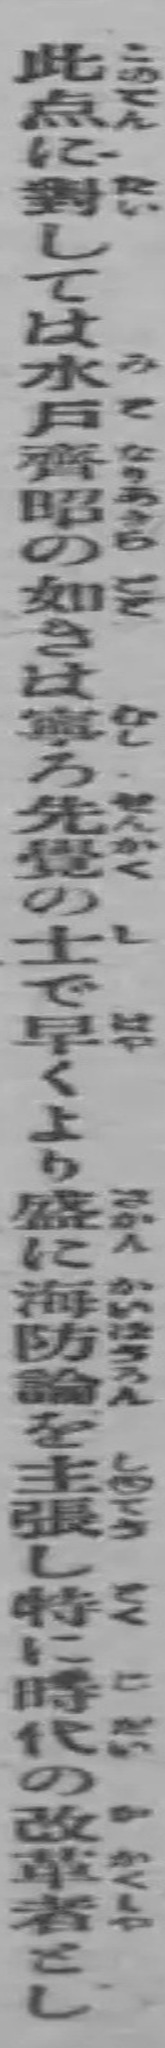此点に対しては水戸斉昭の如きは寧ろ先覚の士で早くより盛に海防論を主張し特に時代の改革者とし
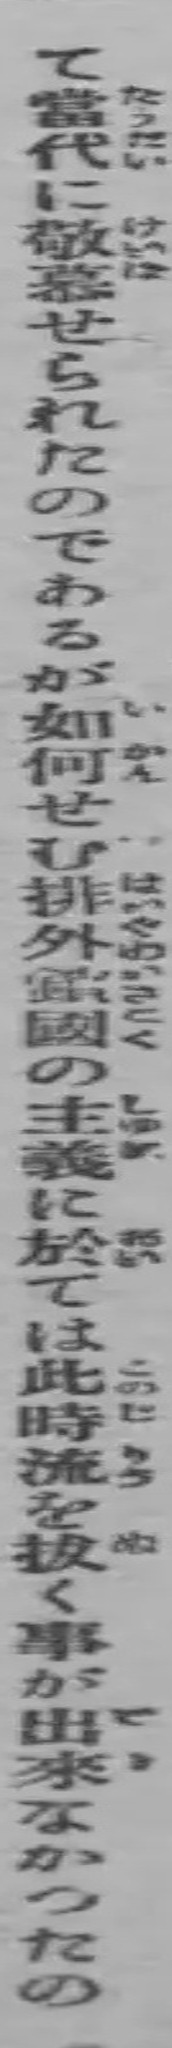て当代に敬慕せられたのであるが如何せむ排外鎖国の主義に於ては此時流を抜く事が出来なかつたの
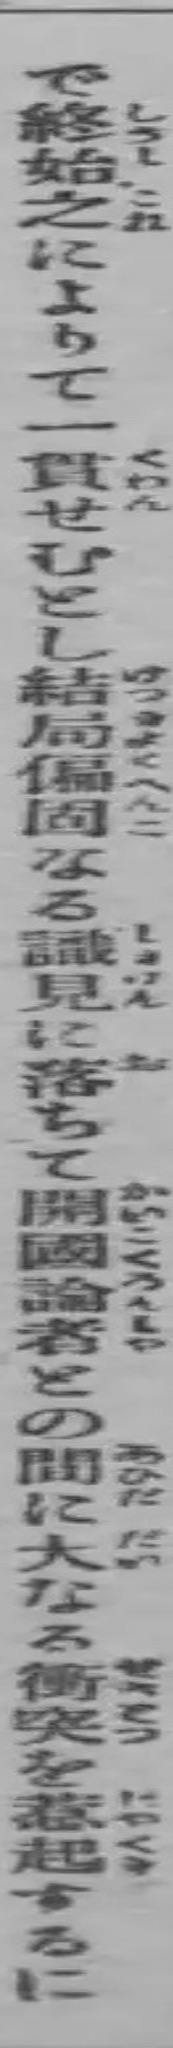で終始之によりて一貫せむとし結局偏固なる識見に落ちて開国論者との間に大なる衝突を惹起するに
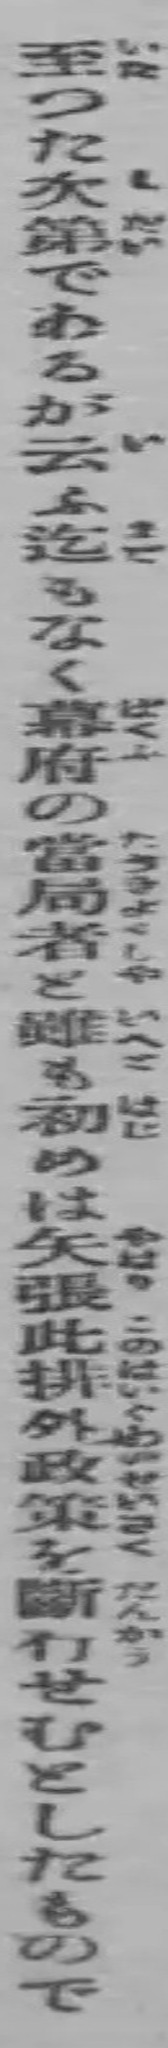至つた次第であるが云ふ迄もなく幕府の当局者と雖も初めは矢張此排外政策を断行せむとしたもので
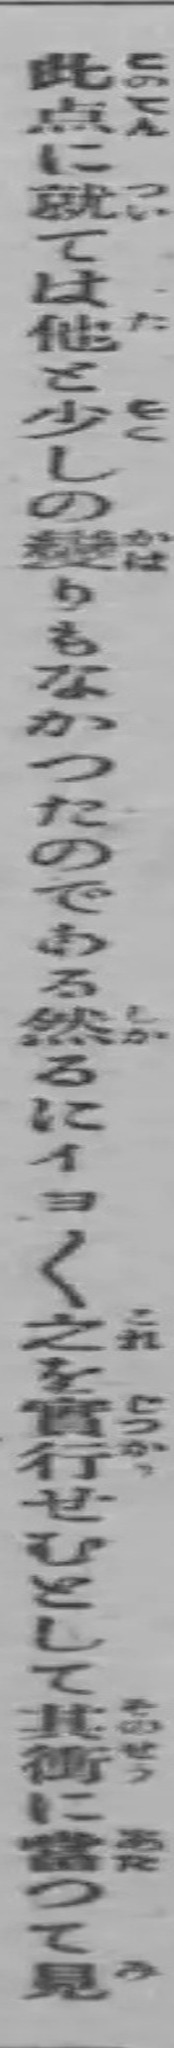此点に就ては他と少しの変りもなかつたのである然るにイヨ〳〵之を実行せむとして其衝に当つて見
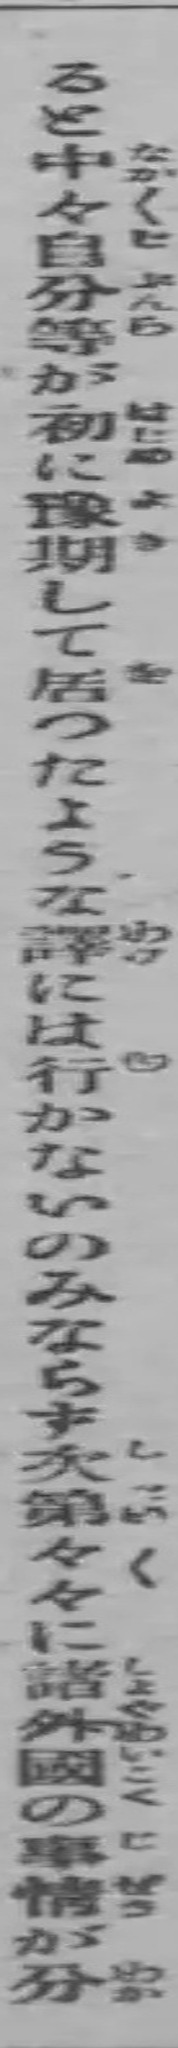ると中々自分等が初に予期して居つたような訳には行かないのみならず次第々々に諸外国の事情が分
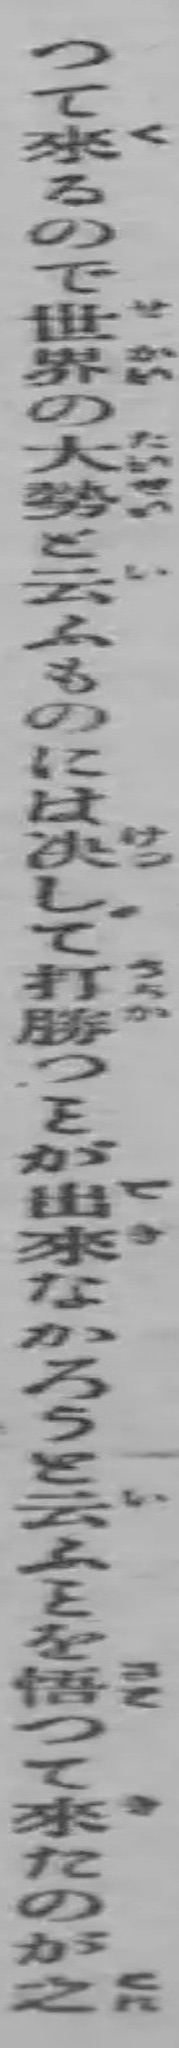つて来るので世界の大勢と云ふものには決して打勝つことが出来なかろうと云ふことを悟つて来たのが之
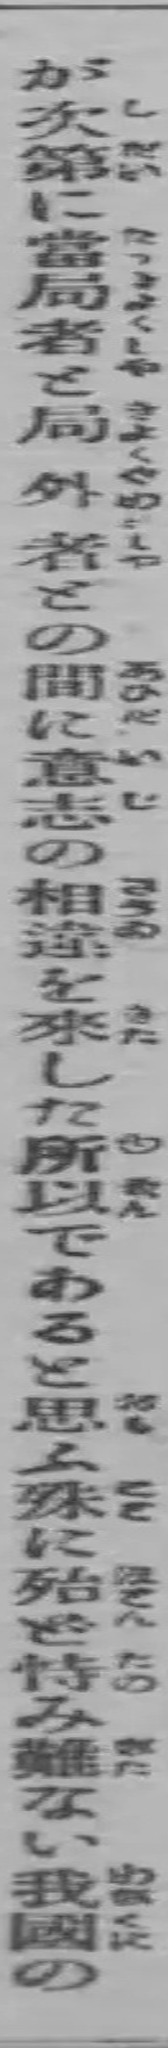が次第に当局者と局外者との間に意志の相違を来した所以であると思ふ殊に殆ど恃み難ない我国の
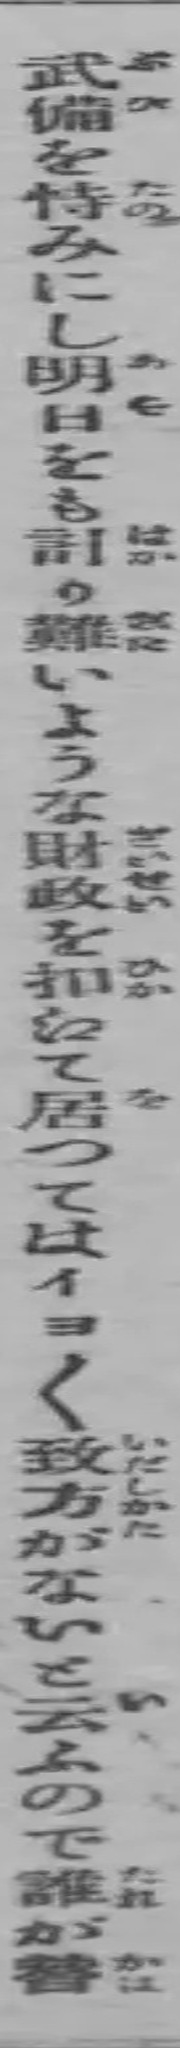武備を恃みにし明日をも計り難いような財政を扣えて居つてはイヨ〳〵致方がないと云ふので誰が替
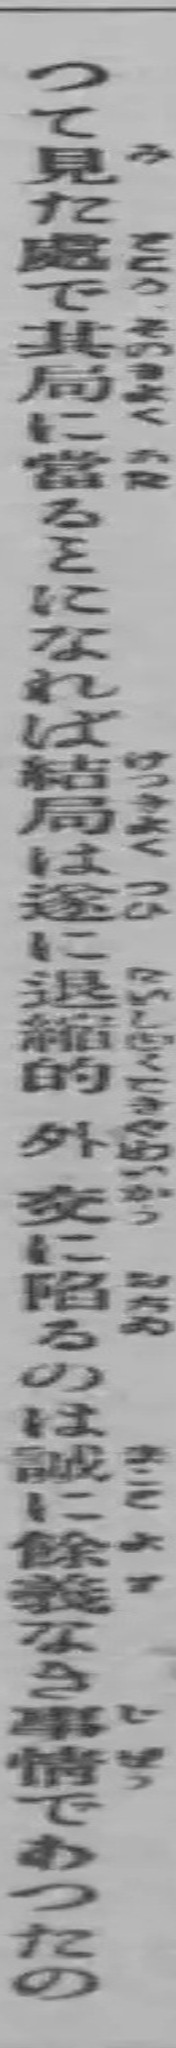つて見た処で其局に当ることになれば結局は遂に退縮的外交に陥るのは誠に余義なき事情であつたの
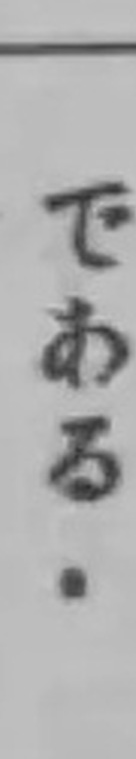である
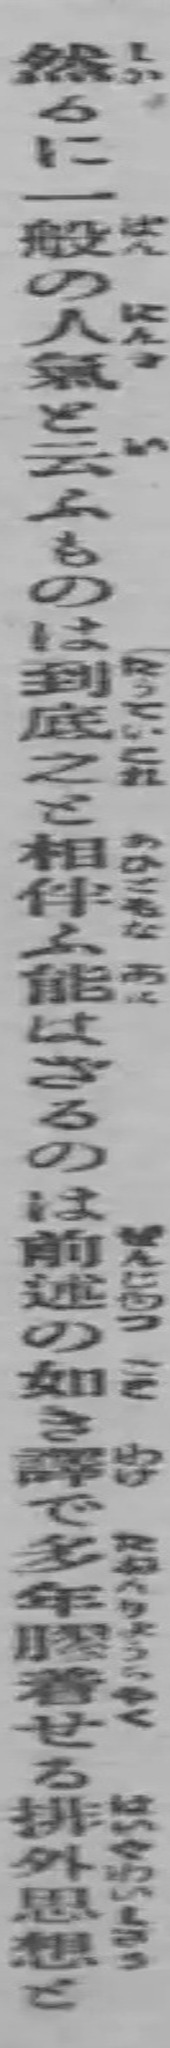然るに一般の人気と云ふものは到底之と相伴ふ能はざるのは前述の如き訳で多年膠着せる排外思想と
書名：豊橋市史談
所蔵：国立国会図書館 National Diet Library, JAPAN
